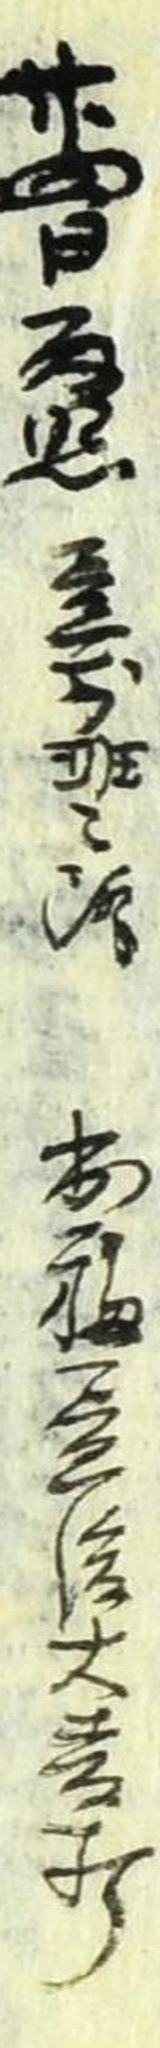廿四日雨照昼前班々降出福昼後大麦打
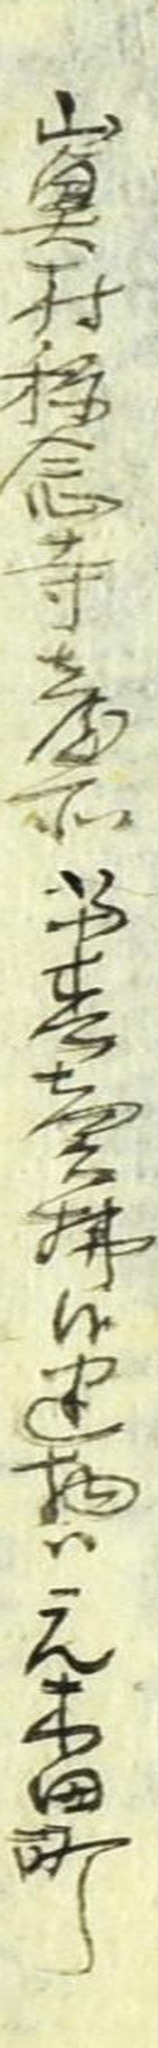山奥村称念寺台所当春売払候建物ハ元木田町
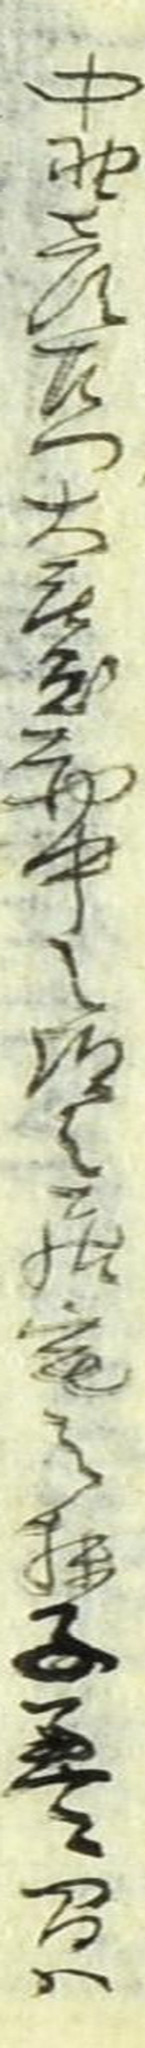中野彦左衛門大庄屋勤中之頃之居宅之様子畳間ハ
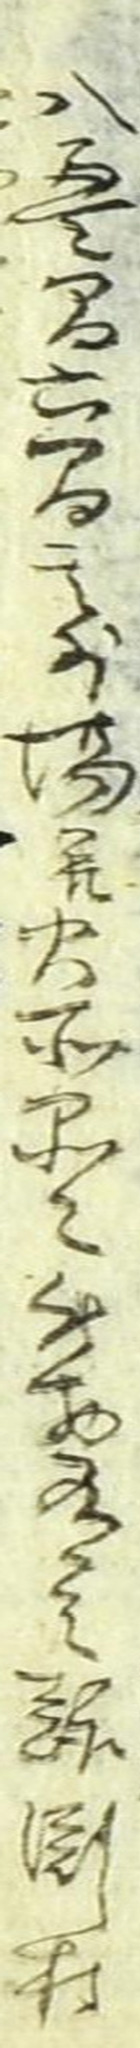八畳間六間其外場幷火所品々付物有之趣淵村
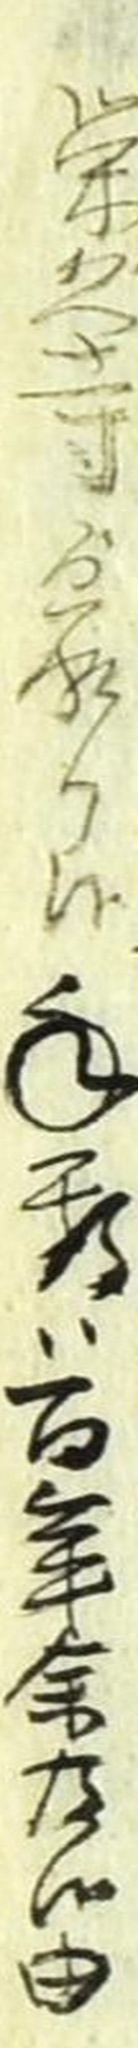栄久寺ゟ預リ候年数ハ百年余及候由

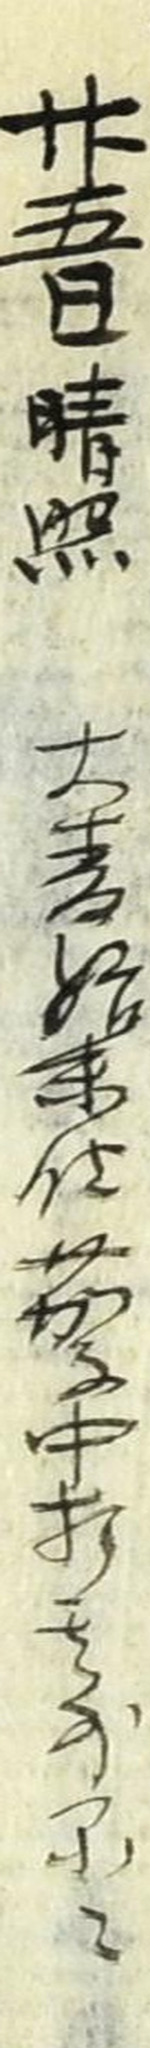廿五日晴照大麦始末仕茄子中打其外品々
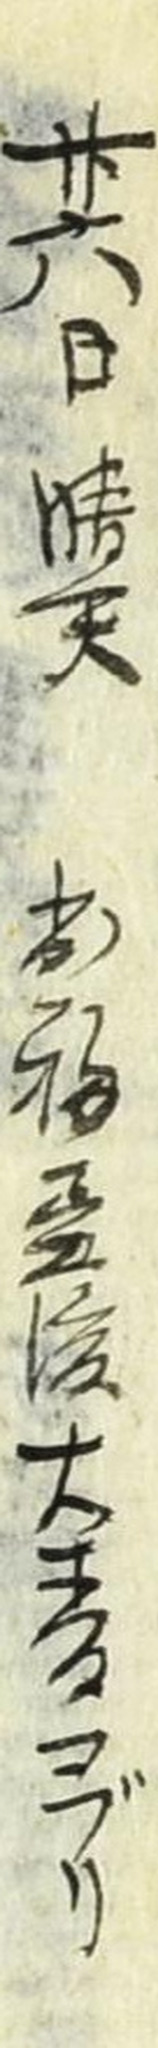廿六日晴天出福昼後大麦コブリ
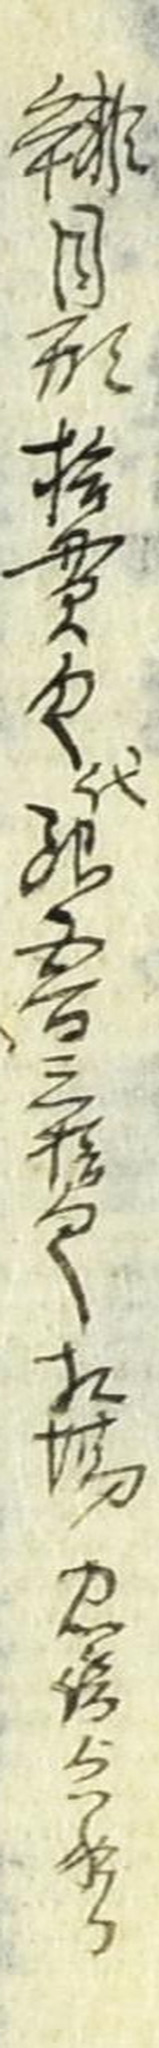鯡目形拾貫匁代銀五百三十匁相場忠後ゟ承リ
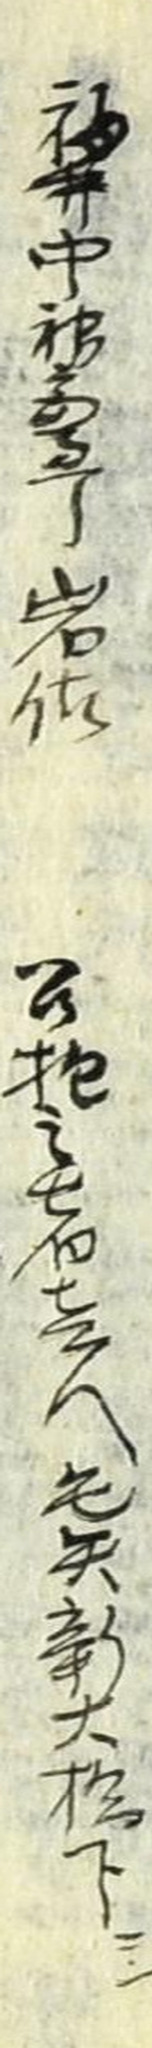福井中神宮寺丁岩佐召抱之者壱人毛矢新大橋下ニ而
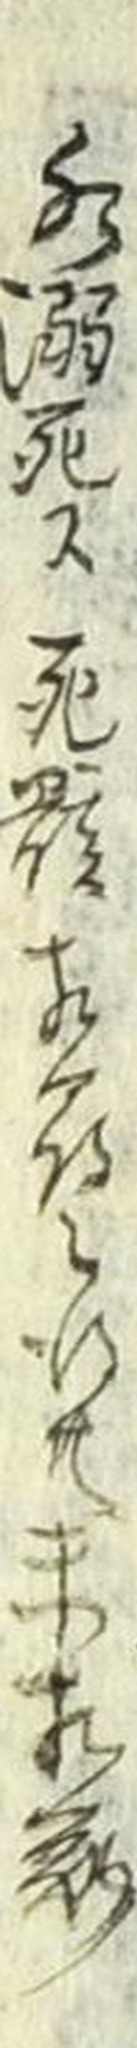水溺死ス死骸相尋候得共未相
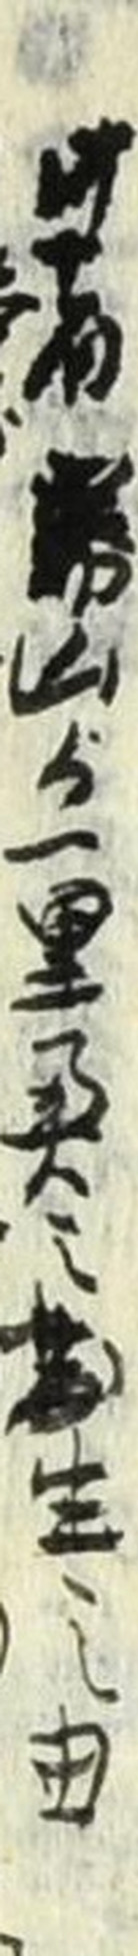此者勝山ゟ一里奥之出生之由
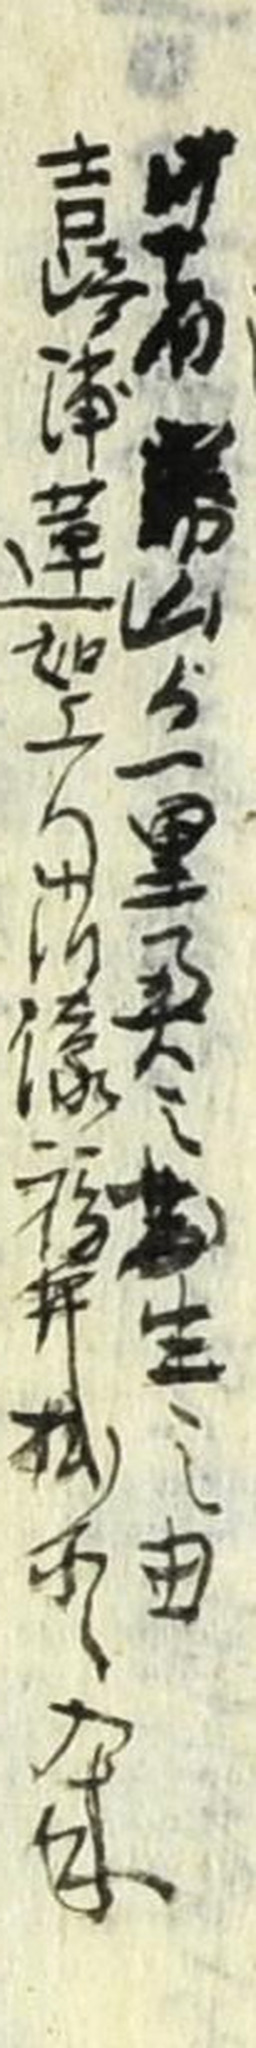吉崎浦蓮如上人肖像福井掛所へ入来
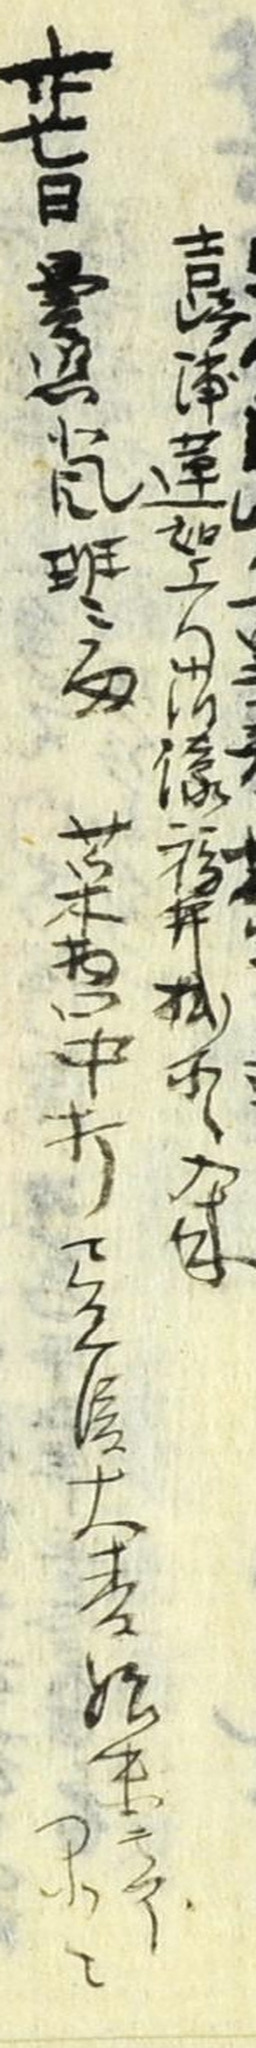廿七日曇照北風班々雨菜惣中打昼後大麦始末其外品々
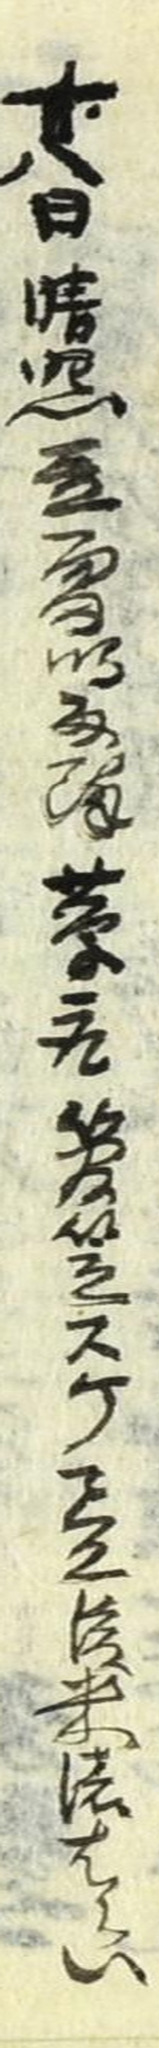廿八日晴照昼雷鳴雨降草取菅笠スケ昼後米俵はらい
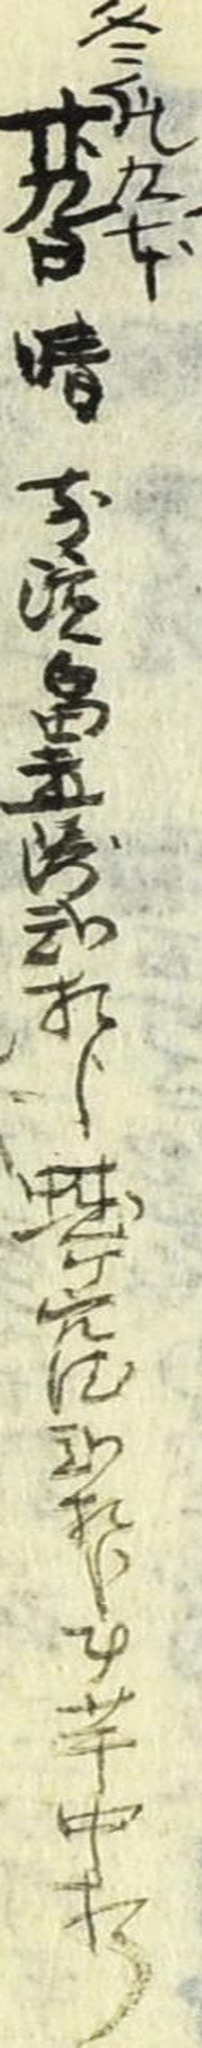廿九日晴前浜畠立崎弐拾歩蛙ヶ窪弐拾歩計芋中打
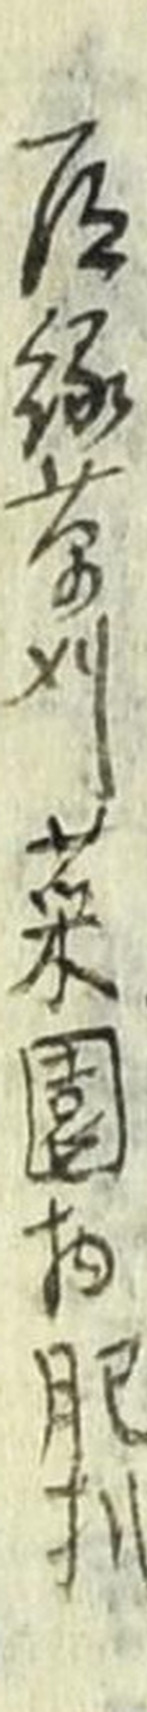道縁草刈菜園物肥掛
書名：（日記）
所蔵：福井県文書館 Fukui Prefectural Archives
